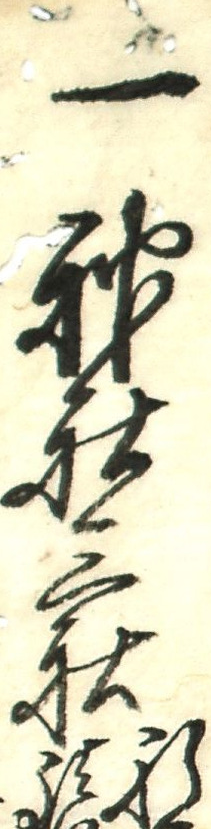一神社三社鎮守
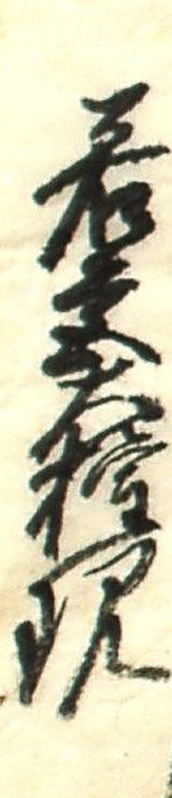若宮大権現

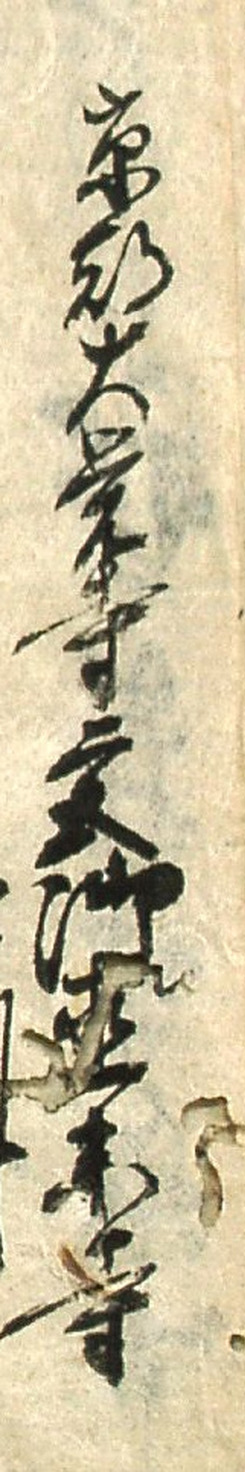京都大覚寺宮御直末寺
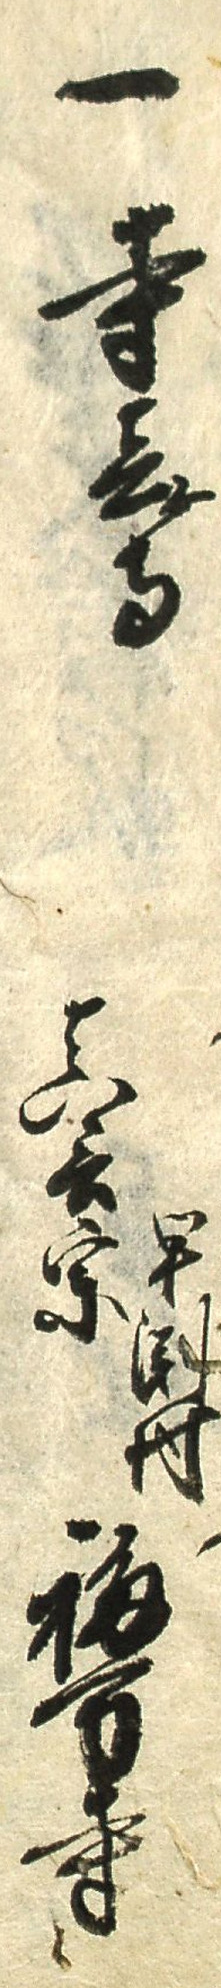一寺壱寺真言宗早渕村福万寺
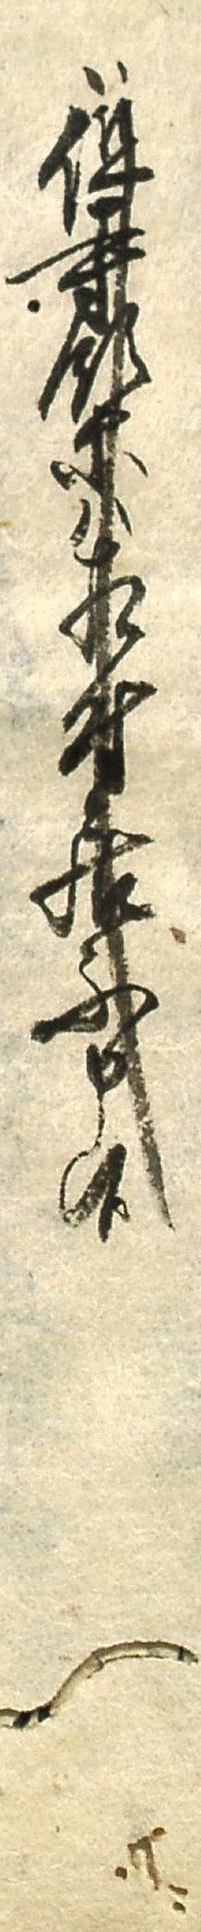但寺領等ハ相付居不申候
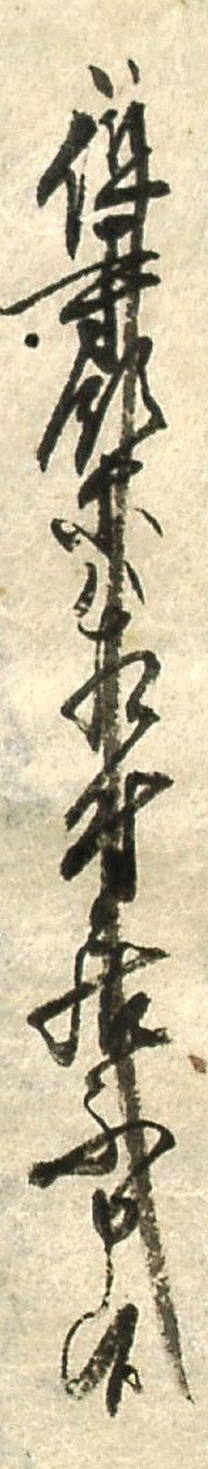但寺領等ハ相付居不申候
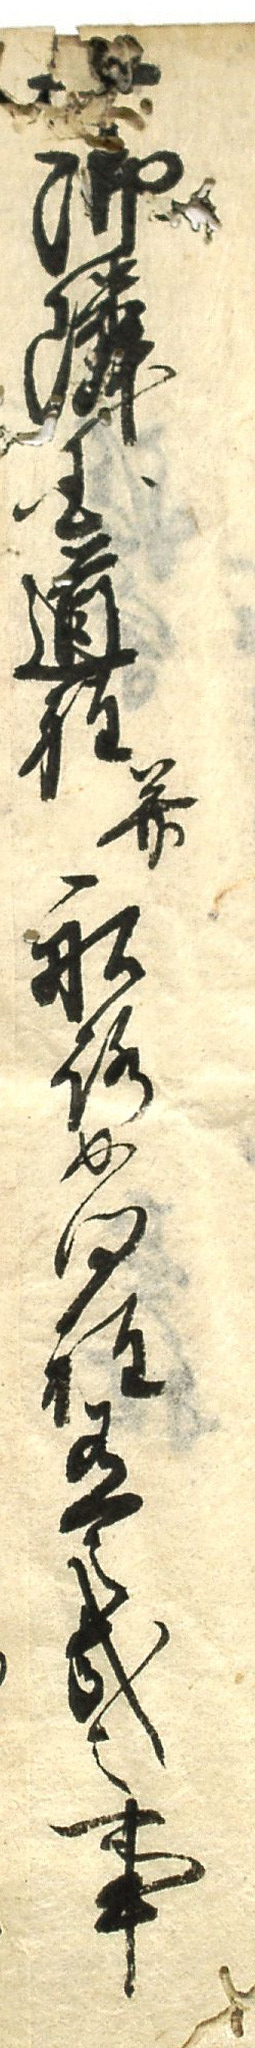一御隣国道程幷舩路如何程有之哉之事
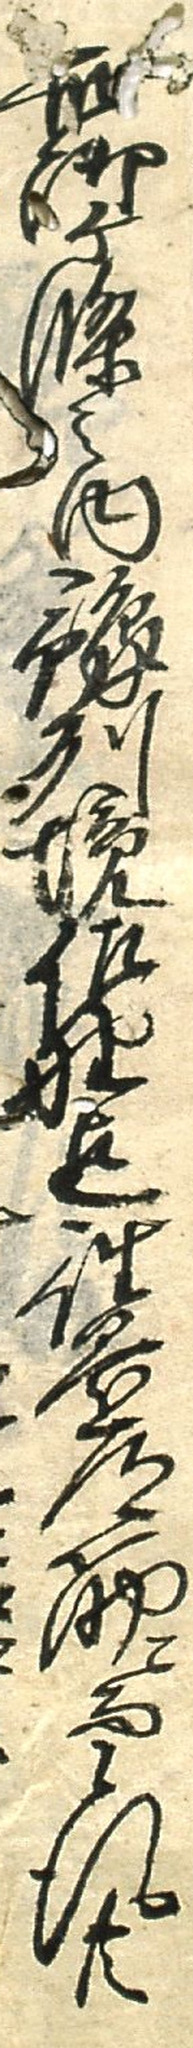此御ヶ條之内豫州境佐野迄御往還道筋ニ而候得共
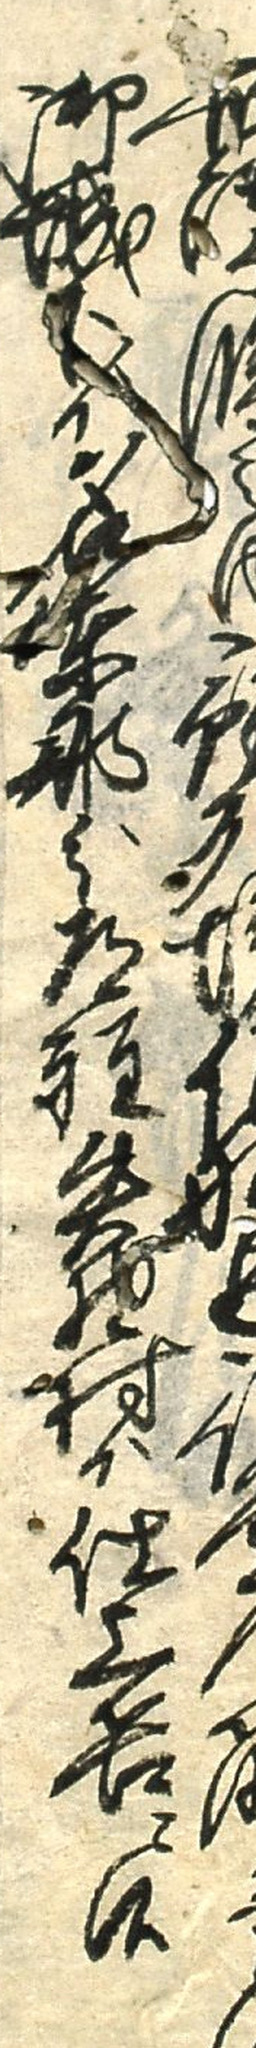御城下ゟ名東郡之道程矢野村ゟ仕上筈ニ候
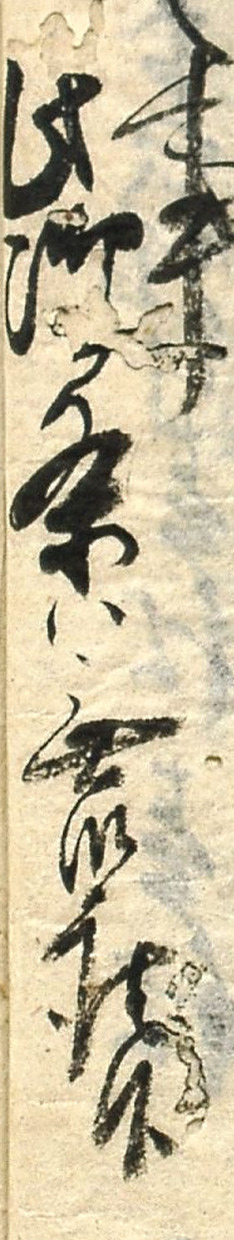此御ヶ条ハ無御座候
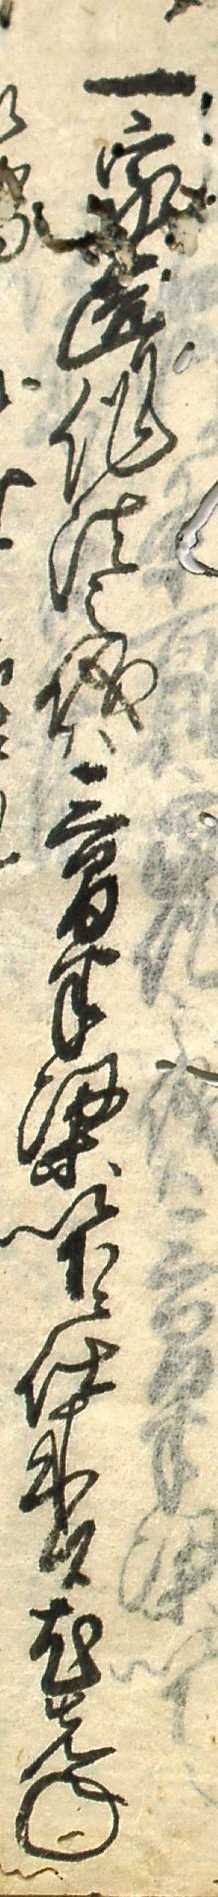一家造り作法之儀ハ三間半梁以下ニ仕成候尤先年
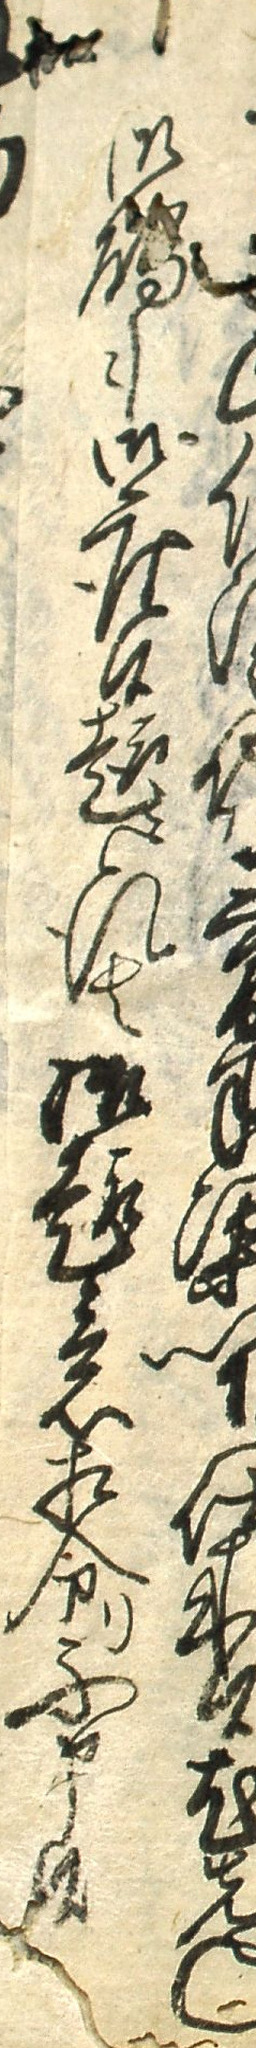御触も御座候趣ニ候得者御趣意相分り不申候
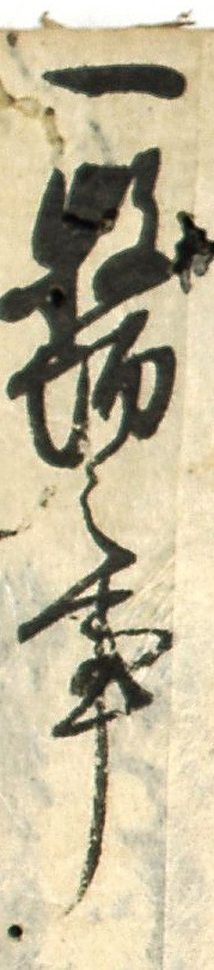一牧場之事
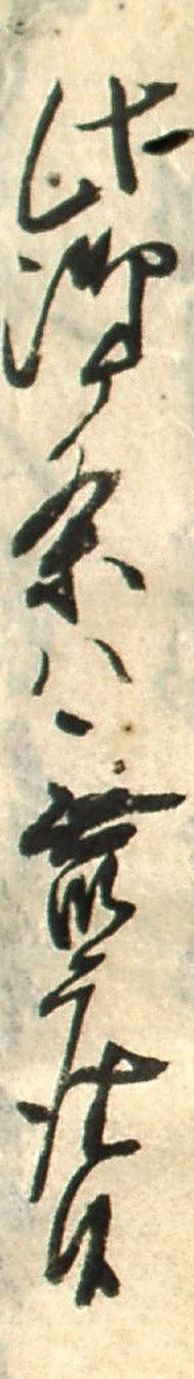此御ヶ条ハ無御座候
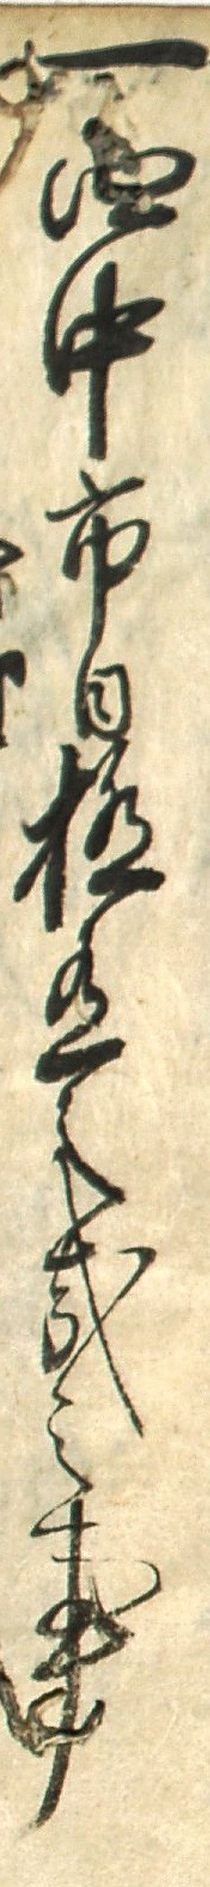一郷中市日極有之哉之事
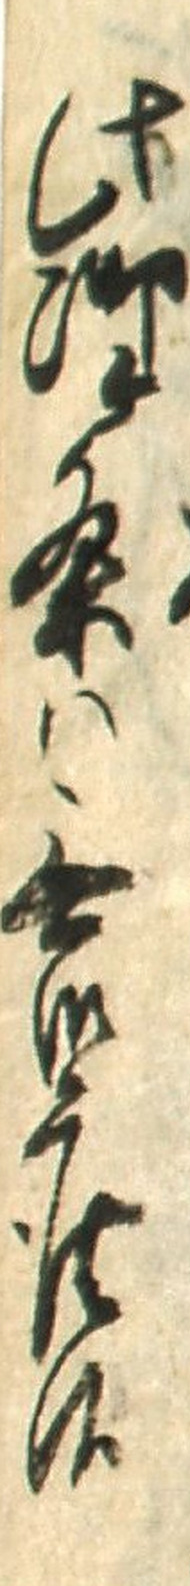此御ヶ条ハ無御座候
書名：御ヶ条ヲ以被仰附株々申上帳（早渕村控）
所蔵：鳴門教育大学 Naruto University of Education
